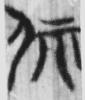𫵖
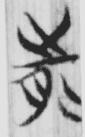之月
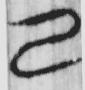己
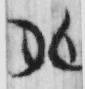卯
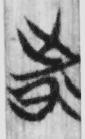之月
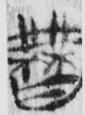○（許）
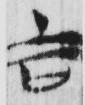吉
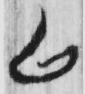㠯（以）
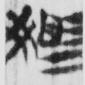駁
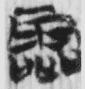霝（靈）
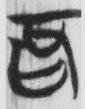爲
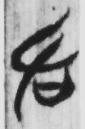左
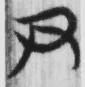尹
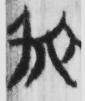{力它}
